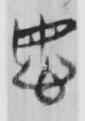悔
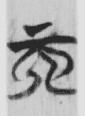而
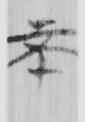不
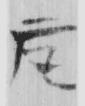厇
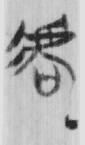唬
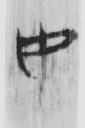女
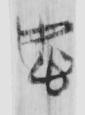悔
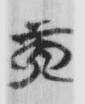而
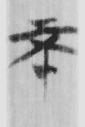不
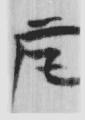厇
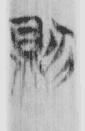則
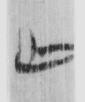亡
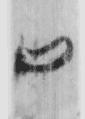㠯（以）
